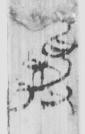嘉
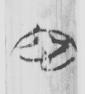{穴心}
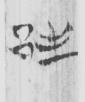邦
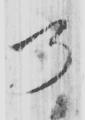乃
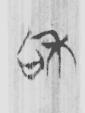和
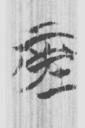坪
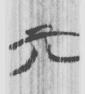亓
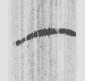一
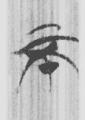不
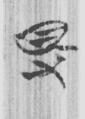𠭁
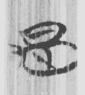是
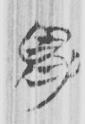{胃刀}
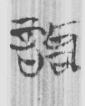詒
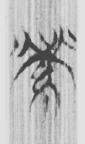縈
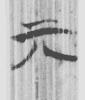亓
